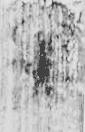○（爨）
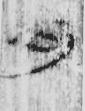月
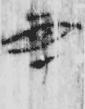辛
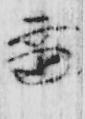梄（酉）
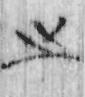之
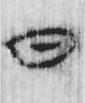日
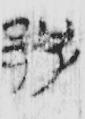○（枝）
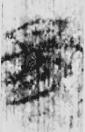昜（陽）
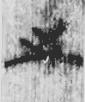之
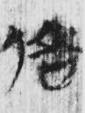俈
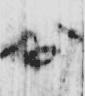公
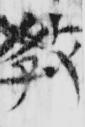○（教）
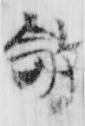○（令）
